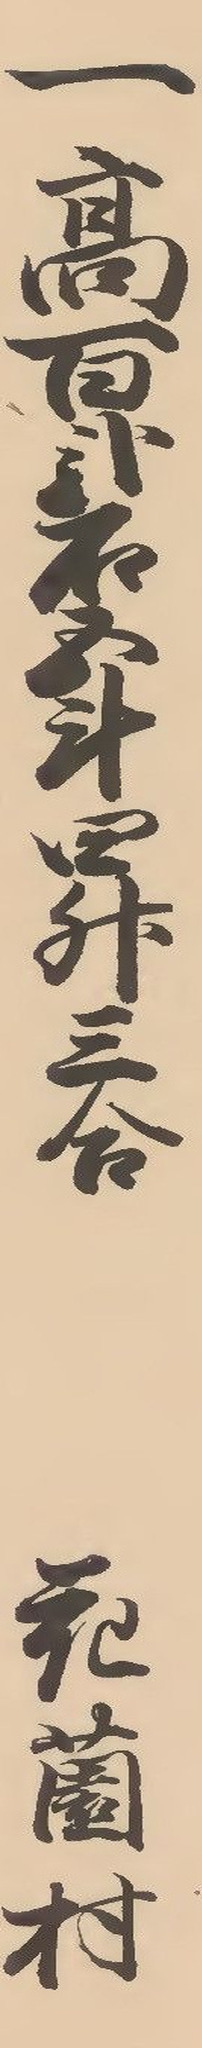一高百弐石五斗四升三合花園村
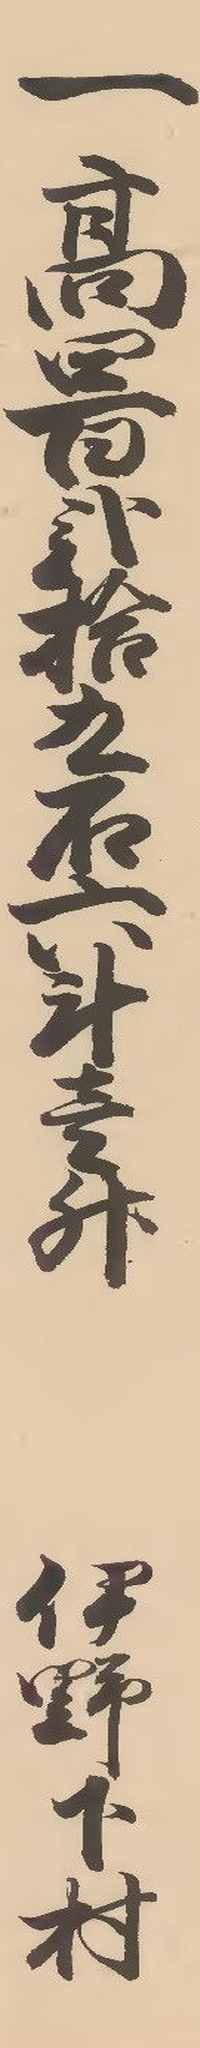一高四百弐拾九石六斗壱升伊野下村
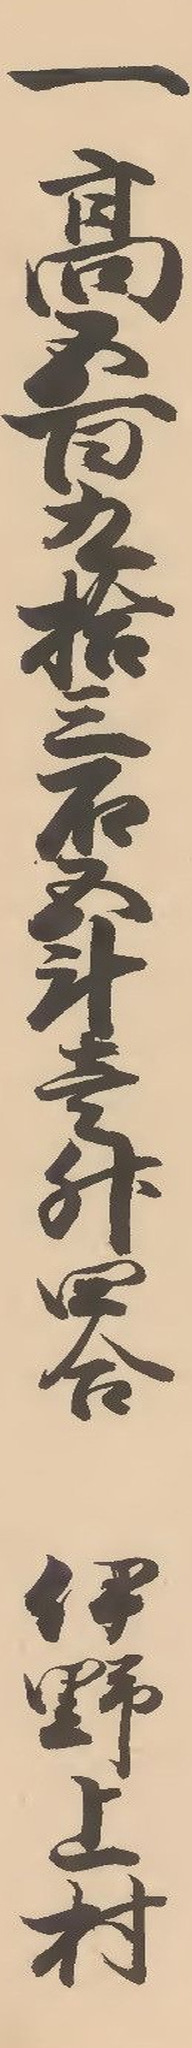一高五百九拾三石五斗壱升四合伊野上村

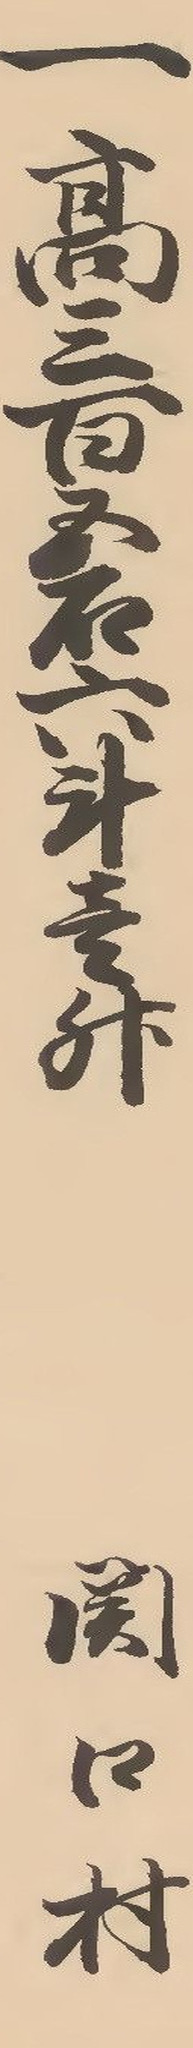一高三百五石六斗壱升関口村
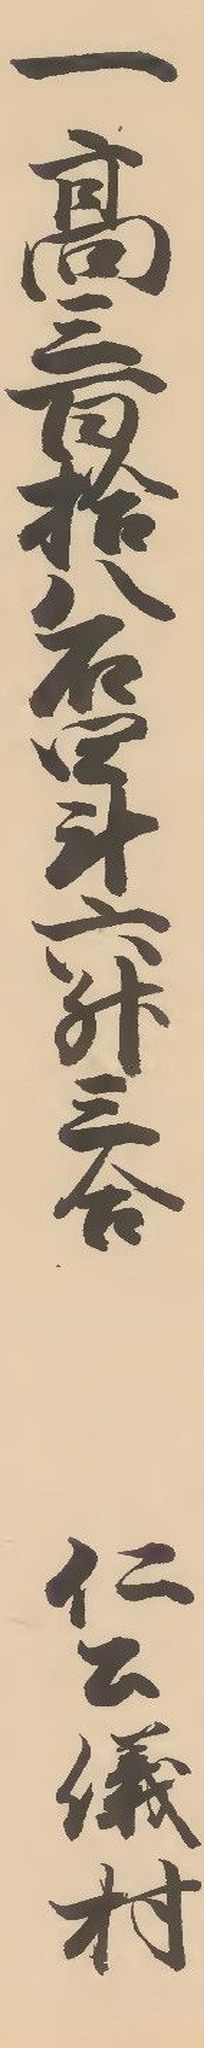一高三百拾八石四斗六升三合仁公儀村
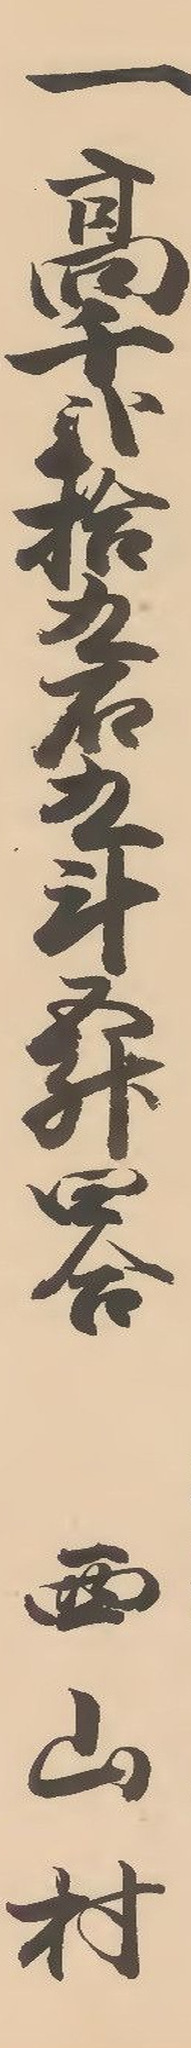一高千弐拾九石九斗五升四合西山村
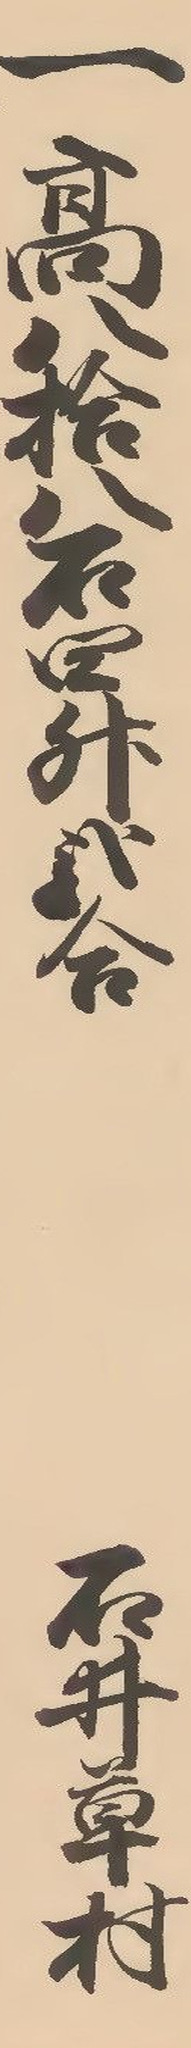一高八拾八石四升弐合石井草村
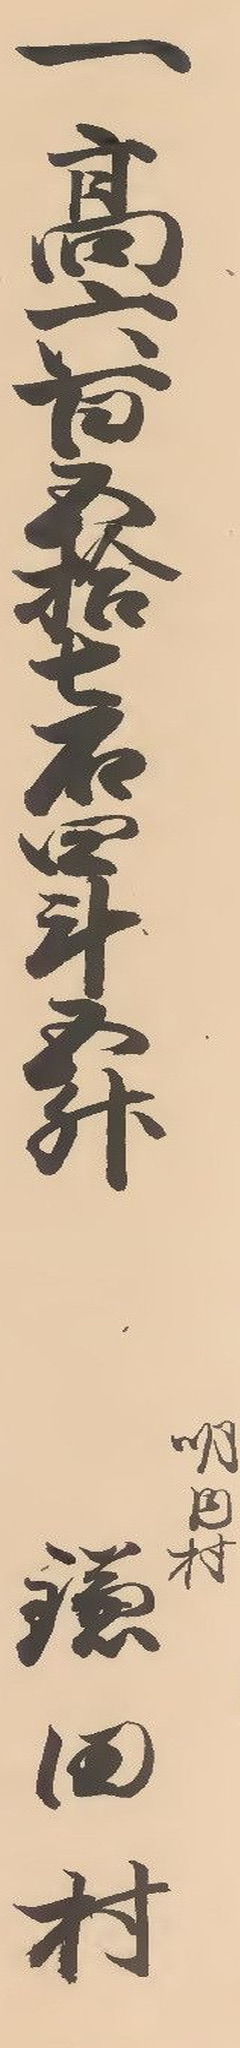一高六百五拾七石四斗五升鎌田村
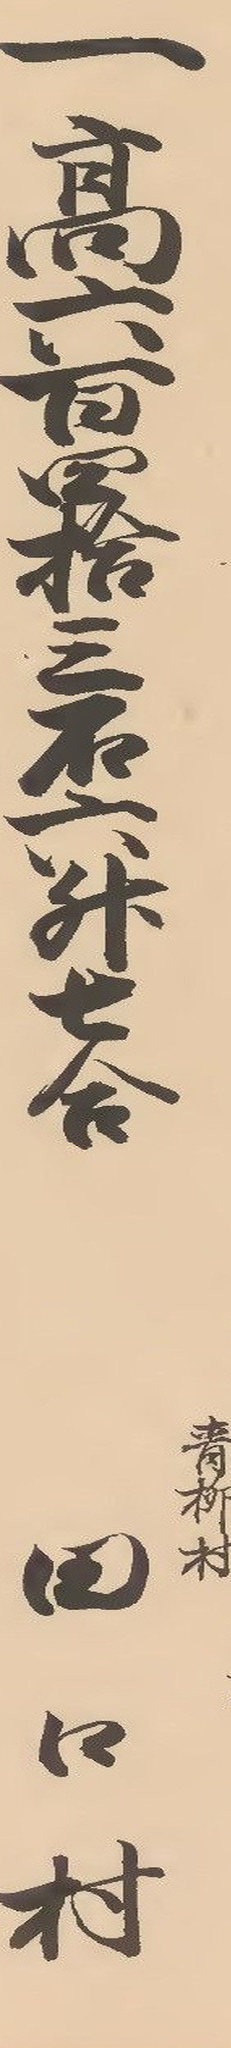一高六百四拾三石六升七合田口村
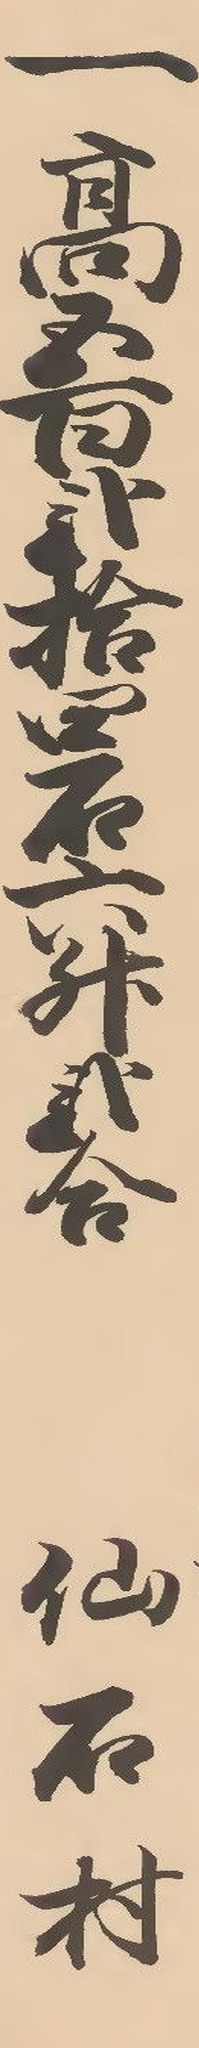一高五百弐拾四石六升弐合仙石村
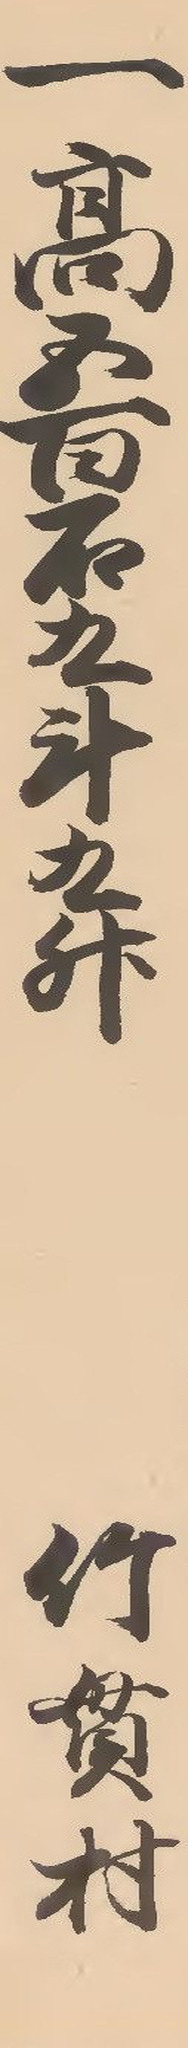一高五百石九斗九升竹貫村

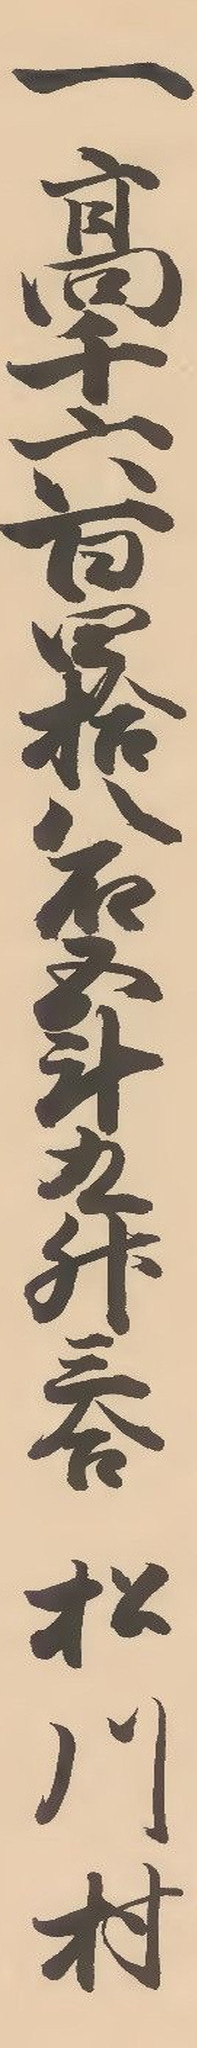一高千六百四拾八石五斗九升三合松川村
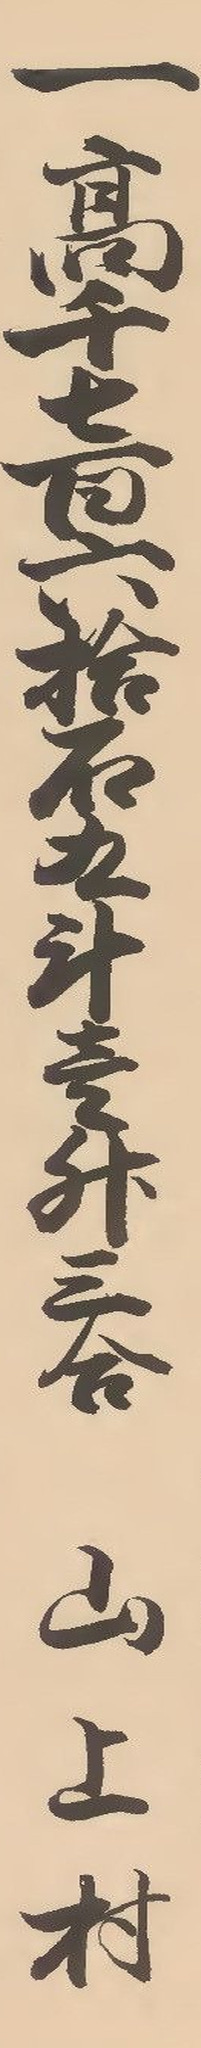一高千七百六拾石九斗壱升三合山上村
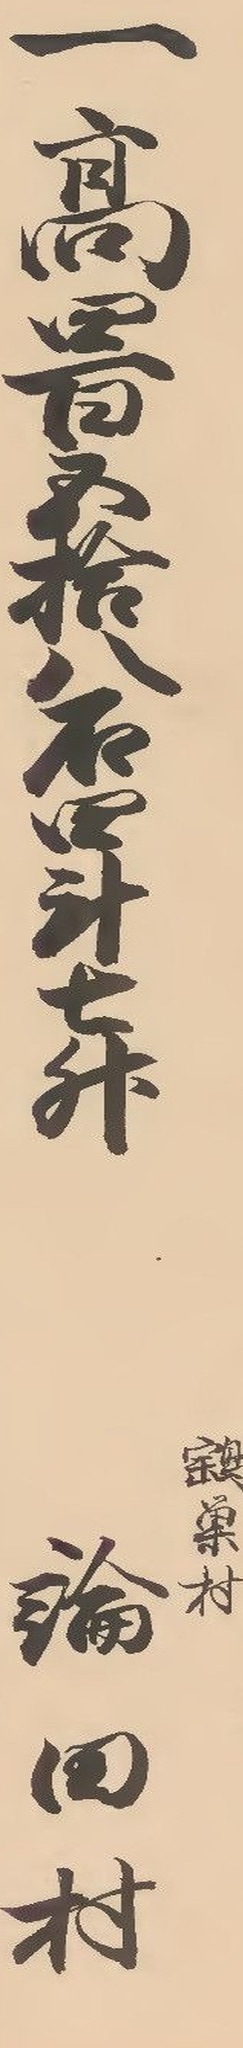一高四百五拾八石四斗七升論田村
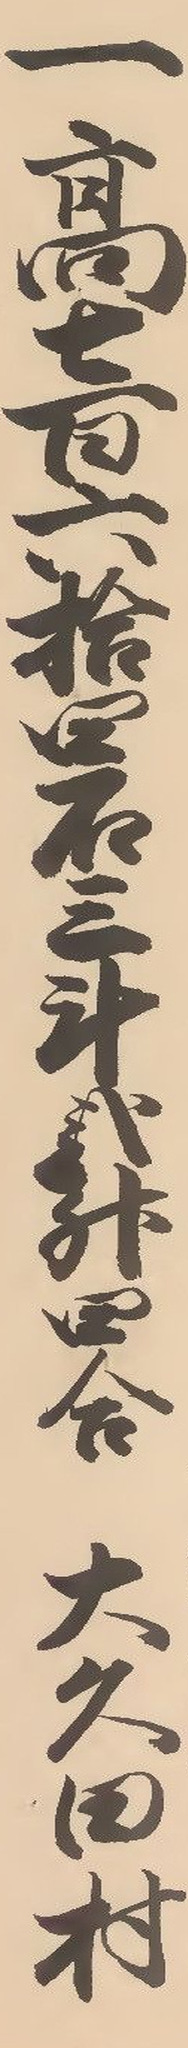一高七百六拾四石三斗弐升四合大久田村
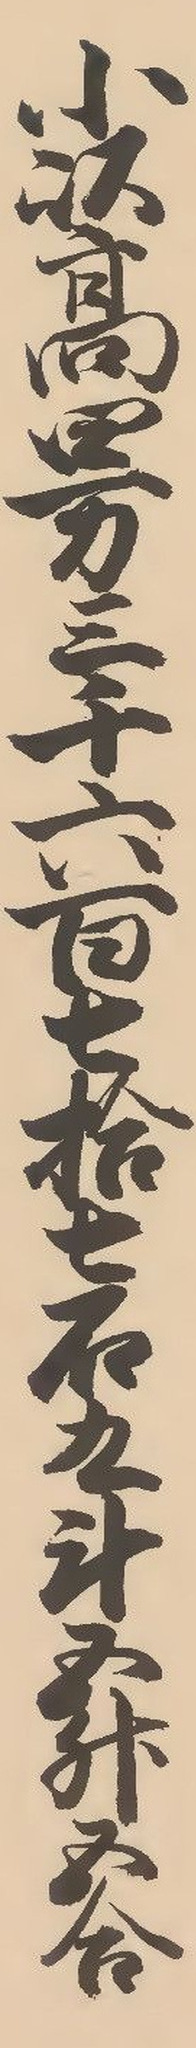小以高四万三千六百七拾七石九斗五升五合
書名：陸奥国郷帳　３
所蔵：国立公文書館 National Archives of Japan
